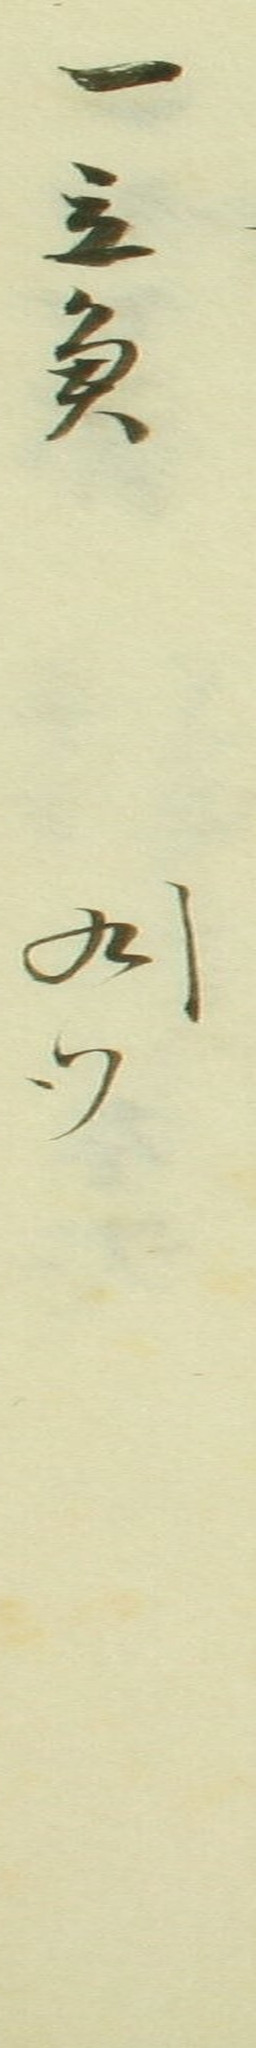一立魚九ツ
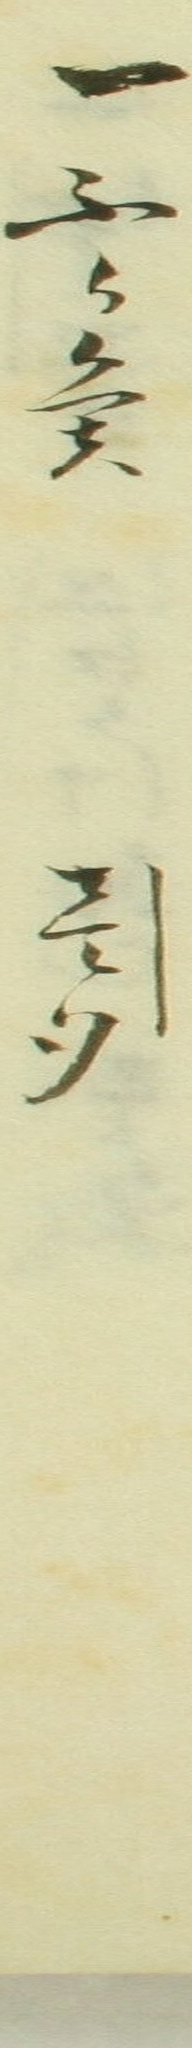一ふか魚壱ツ
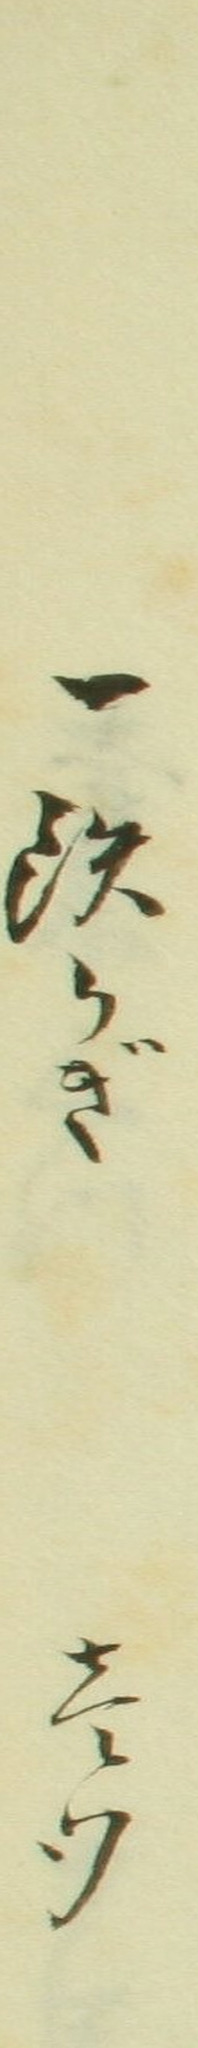一鉄かぎ壱ツ
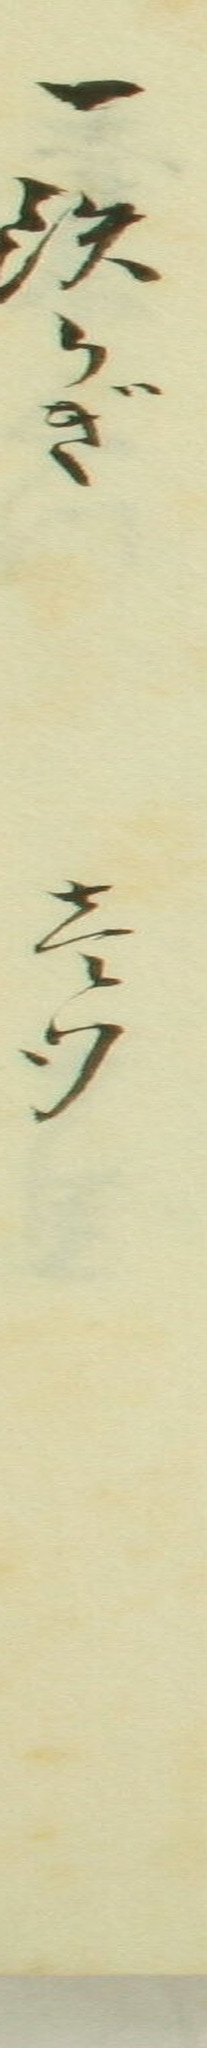一鉄かぎ壱ツ
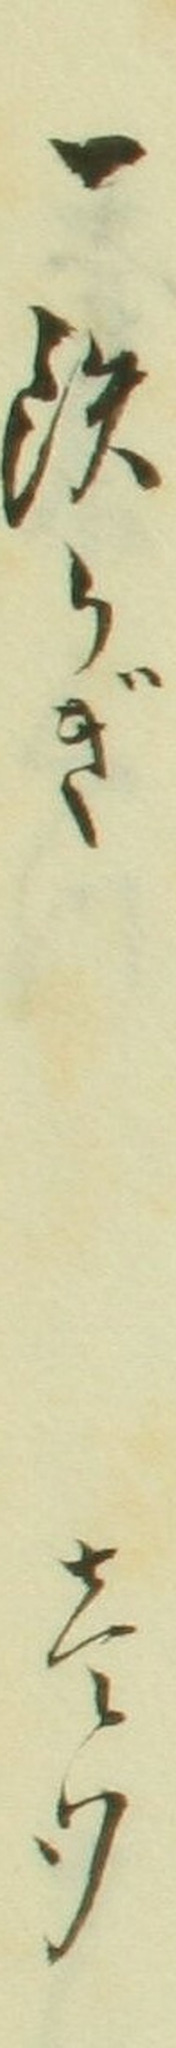一鉄かぎ壱ツ

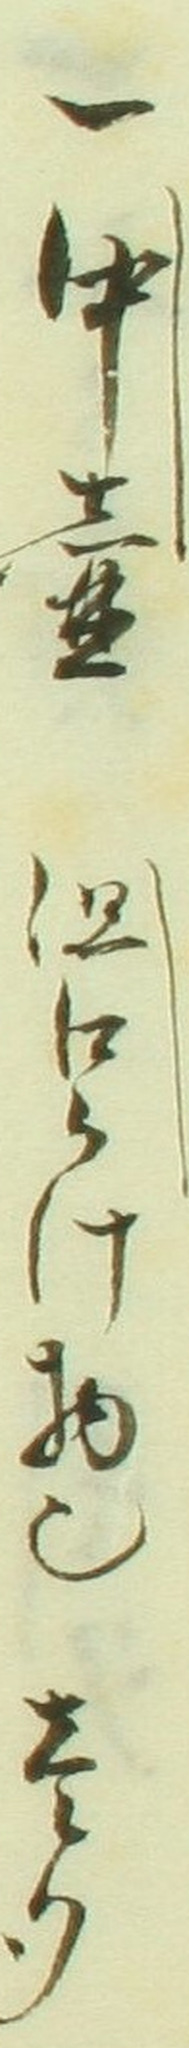一中壺但口かけ物也壱ツ
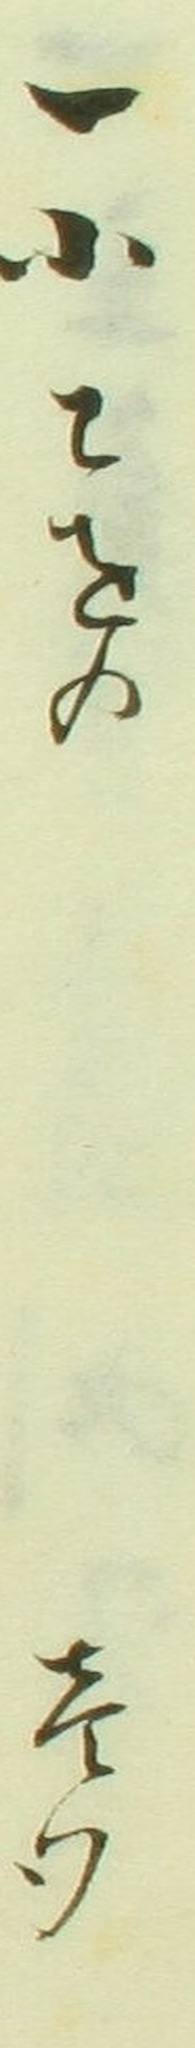一小てをの壱ツ
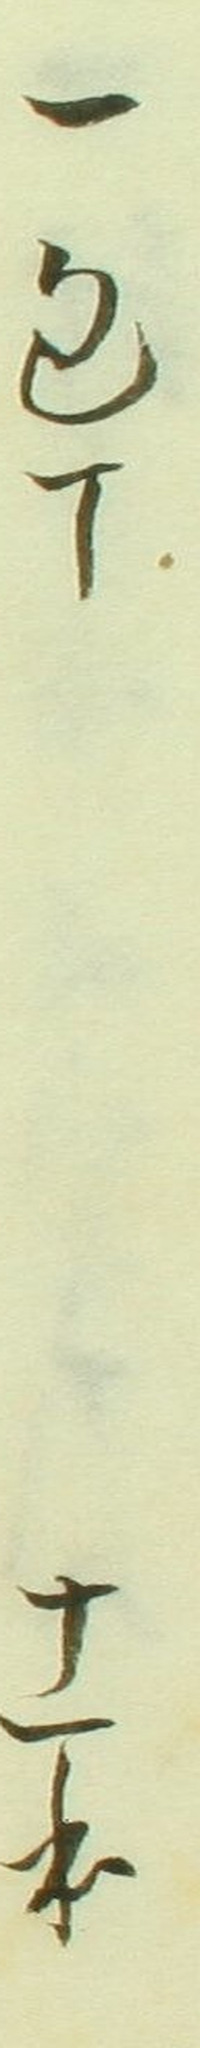一包丁十一本
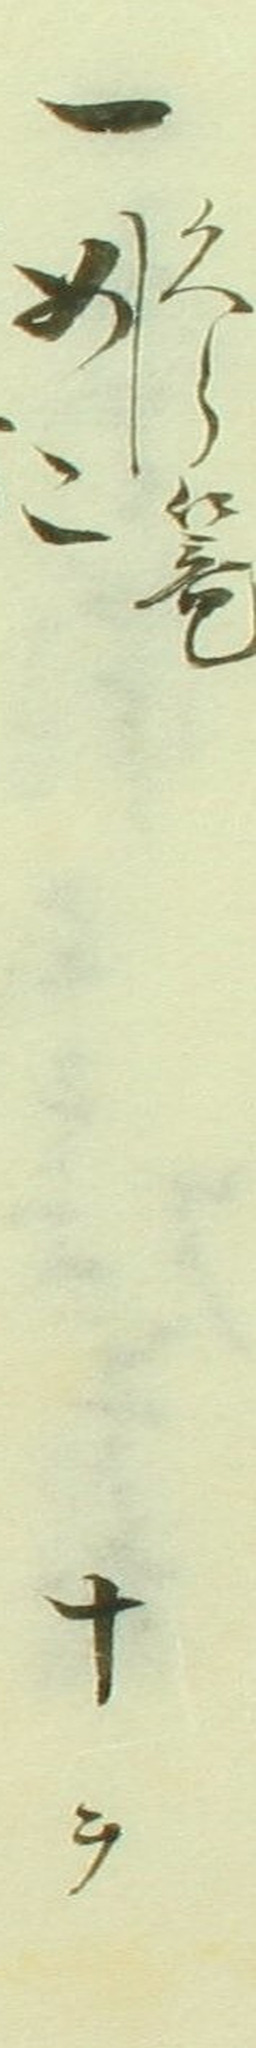一めこ十ツ
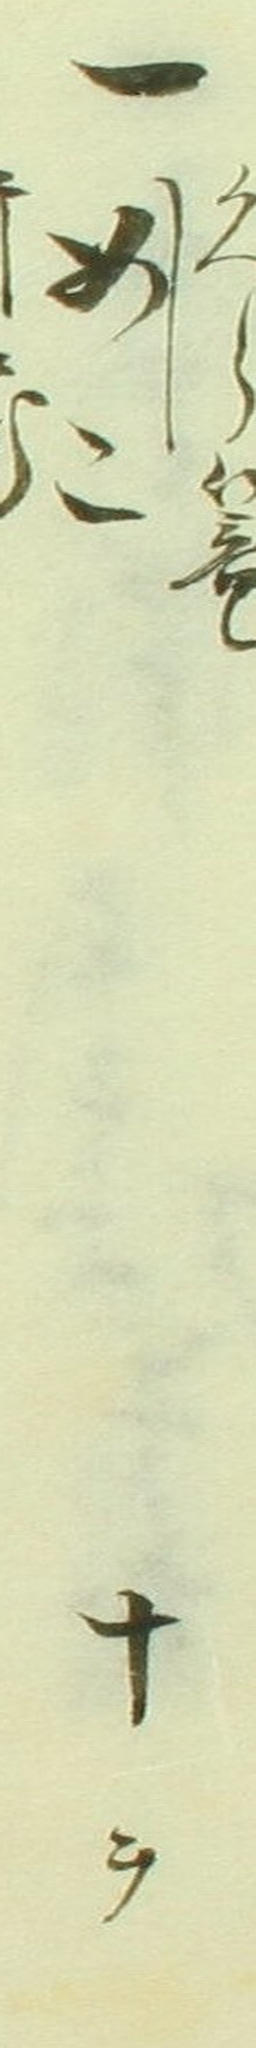一めこ十ツ
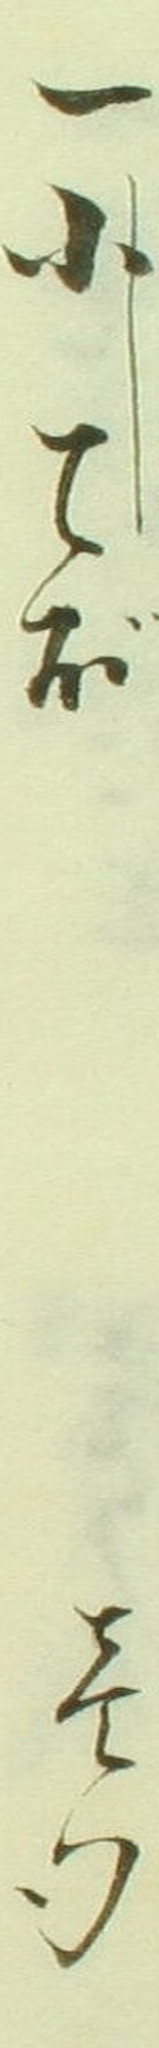一小てぼ壱ツ
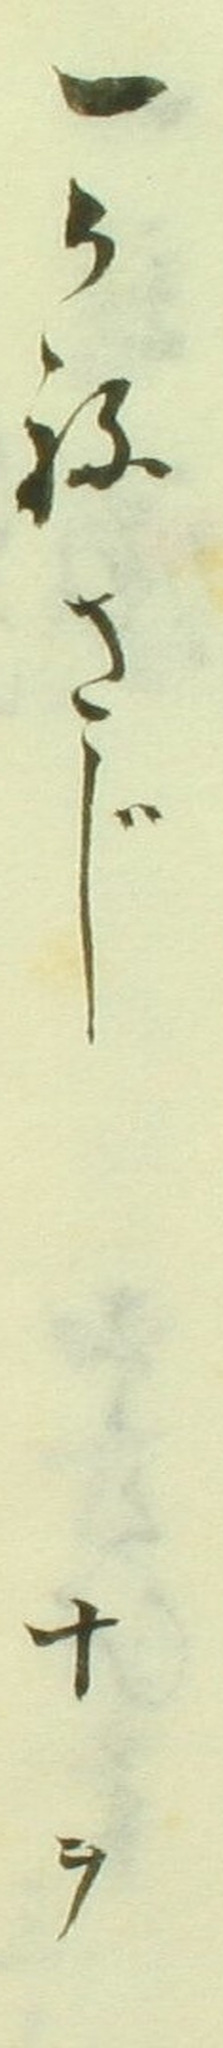一かねさじ十ツ
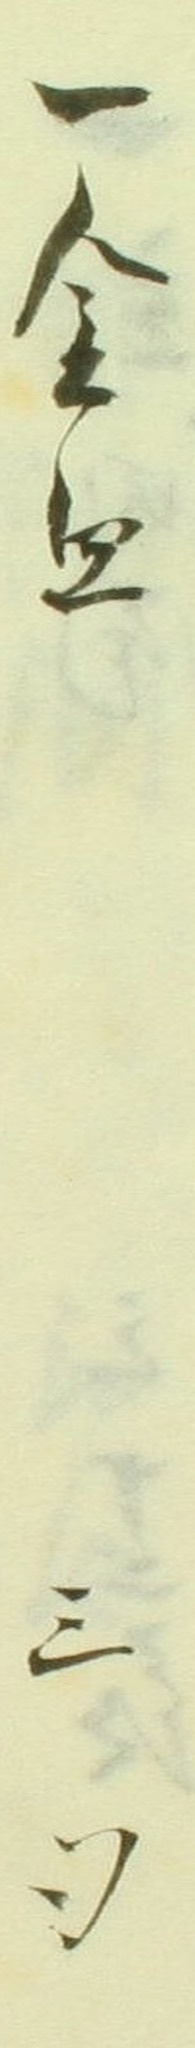一金皿三ツ
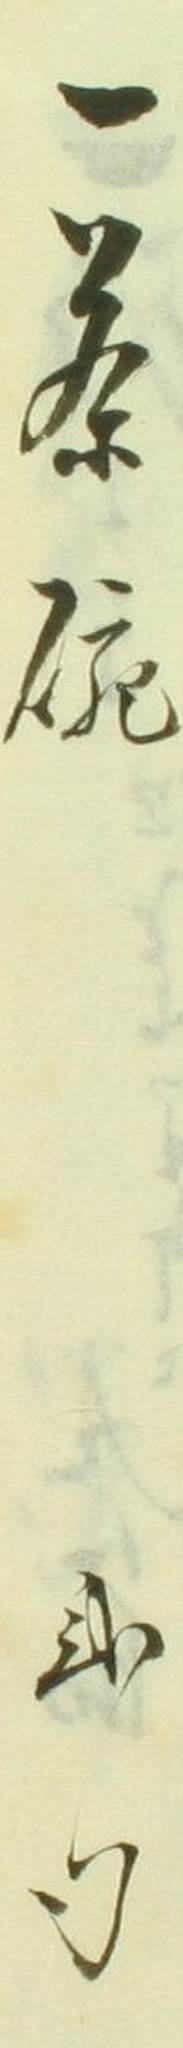一茶碗弐ツ
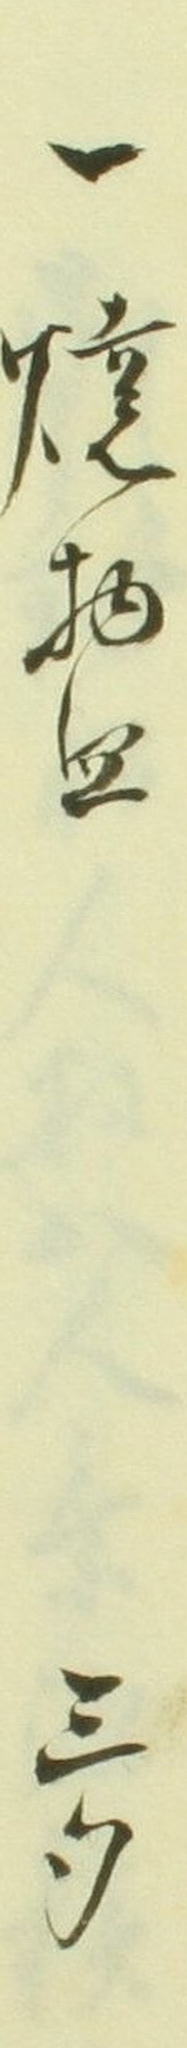一焼物皿三ツ
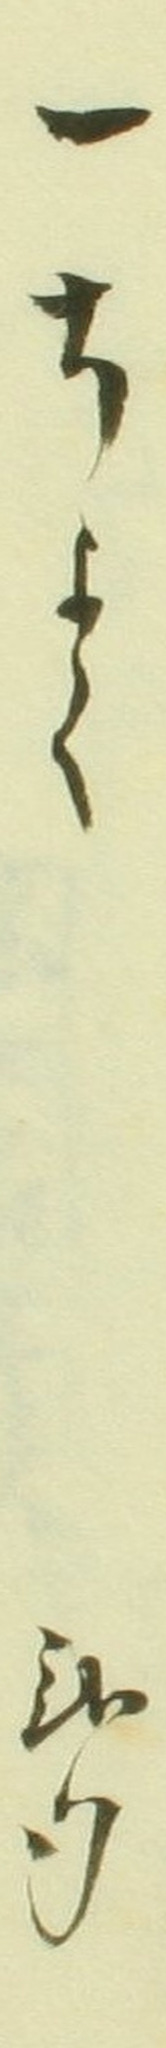一ちよく弐ツ
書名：異国船漂着記
